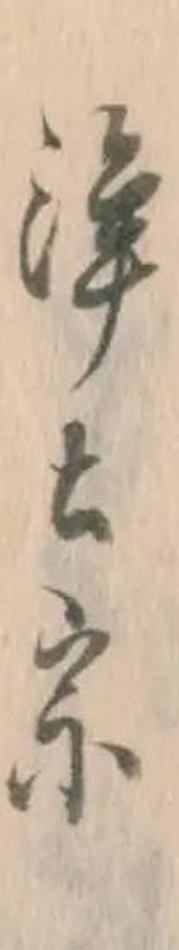浄土宗
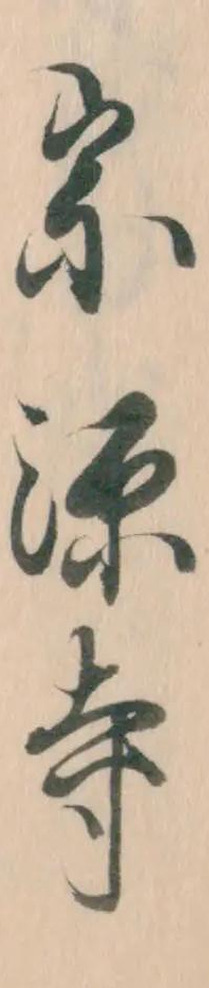宗源寺
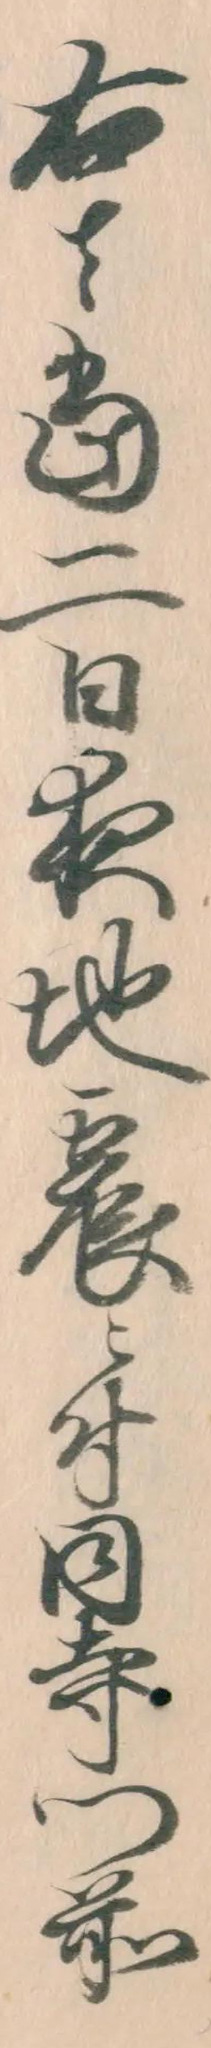右は当二日夜地震ニ付同寺門前
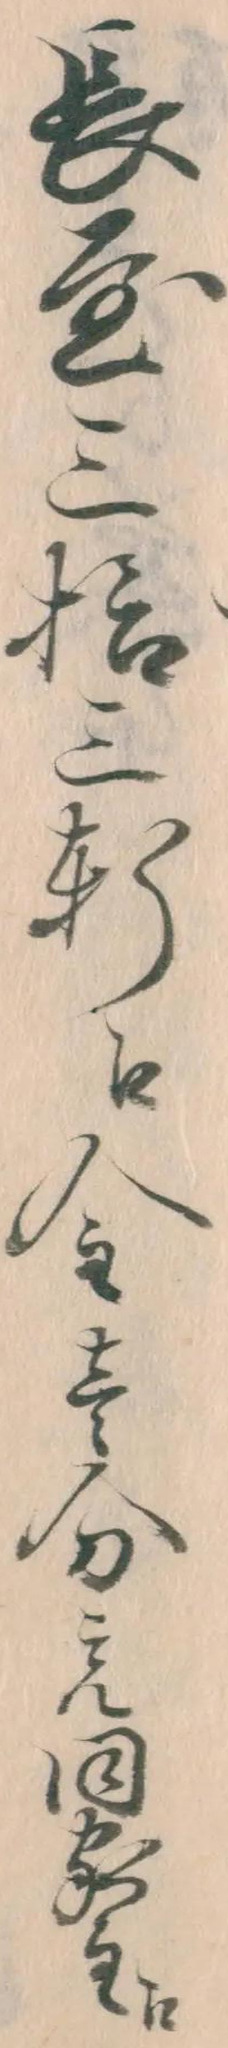長屋三拾三軒え金壱分宛同家主え
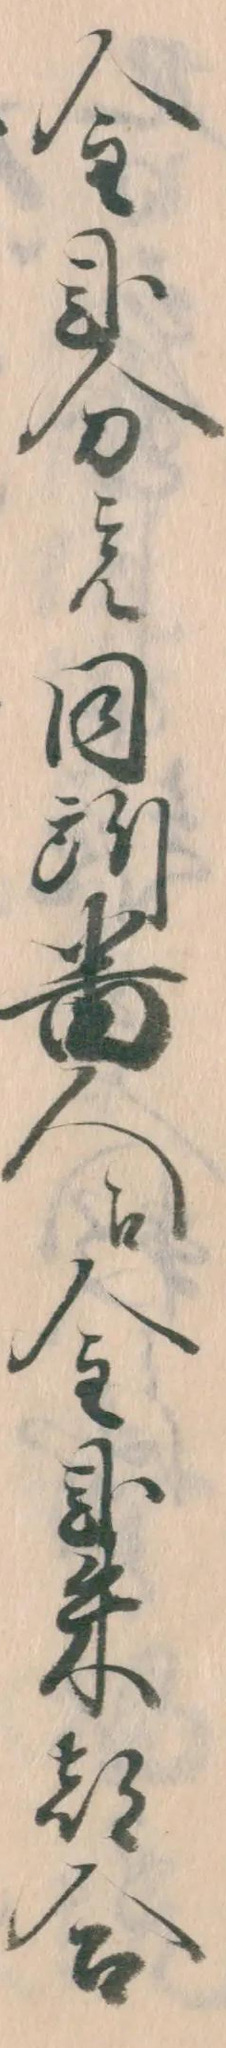金弐分宛同所番人え金弐朱都合
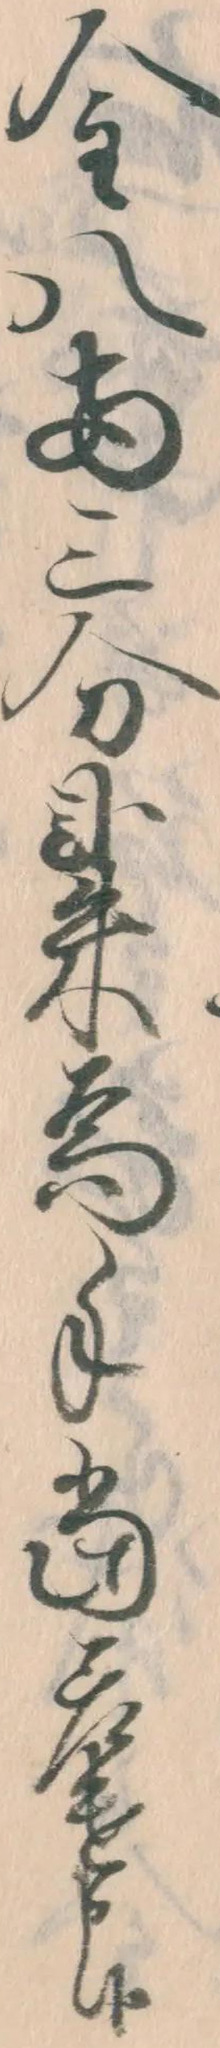金八両三分弐朱為手当差遣申候
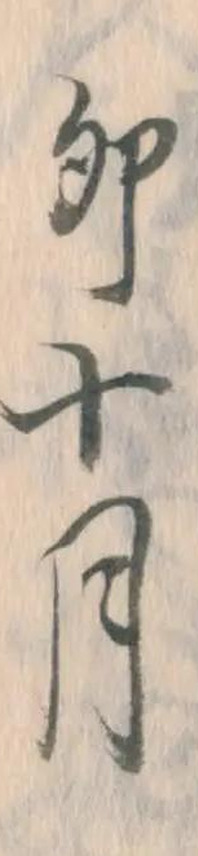卯十月

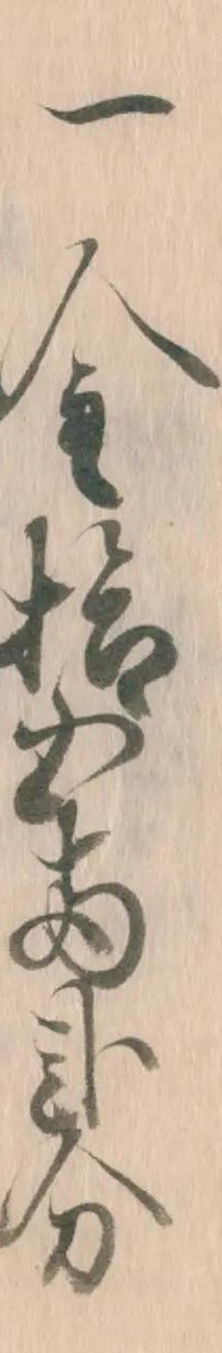一金拾五両弐分
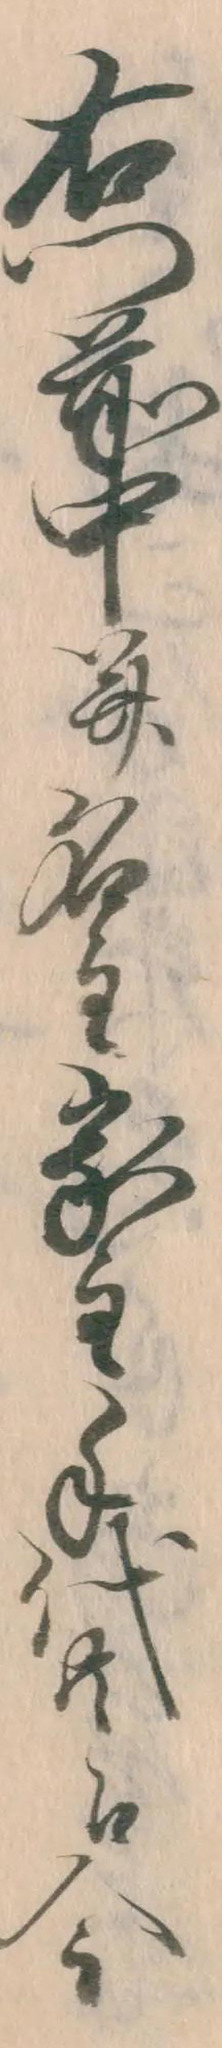右門前中并名主家主手代共え今
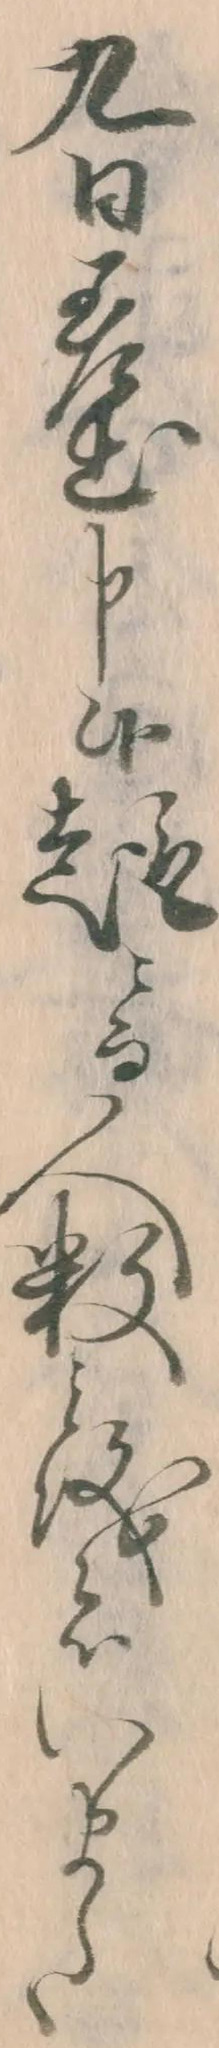九日差出申候趣ニ而人数之儀はいまた
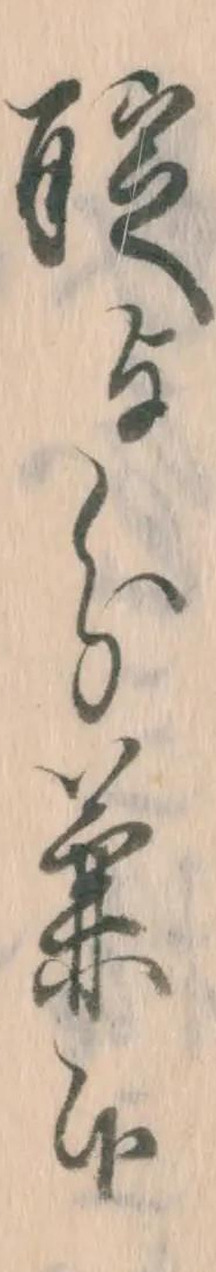聢と分兼候
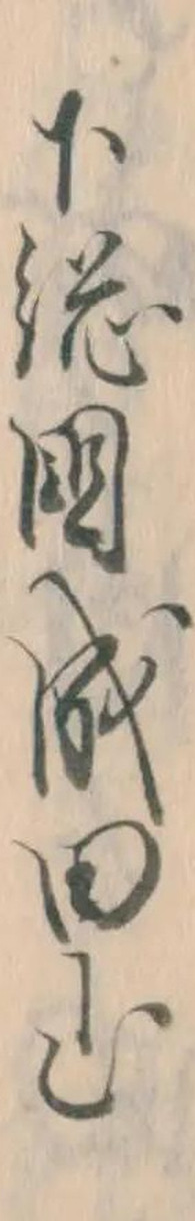下総国成田山
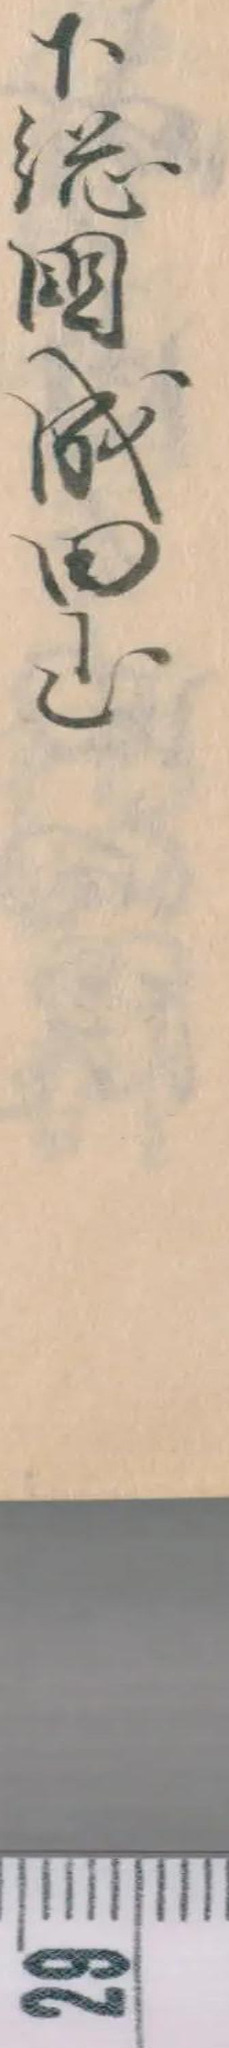下総国成田山
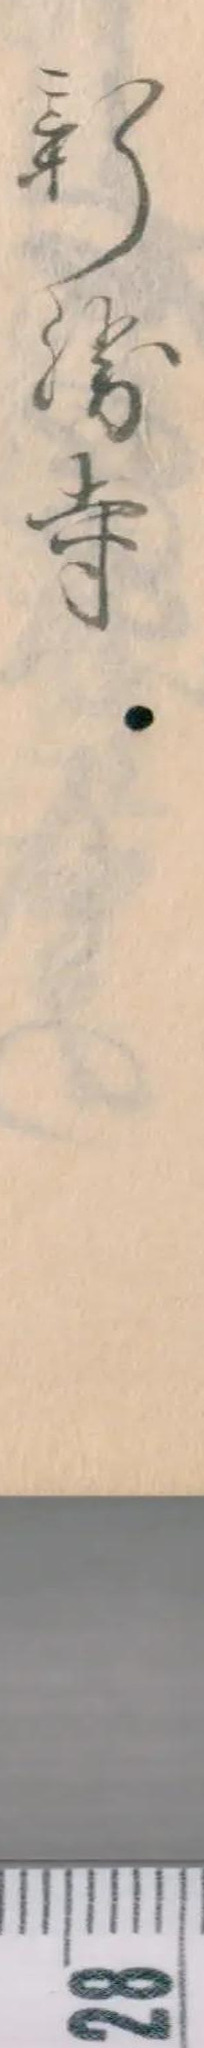新勝寺
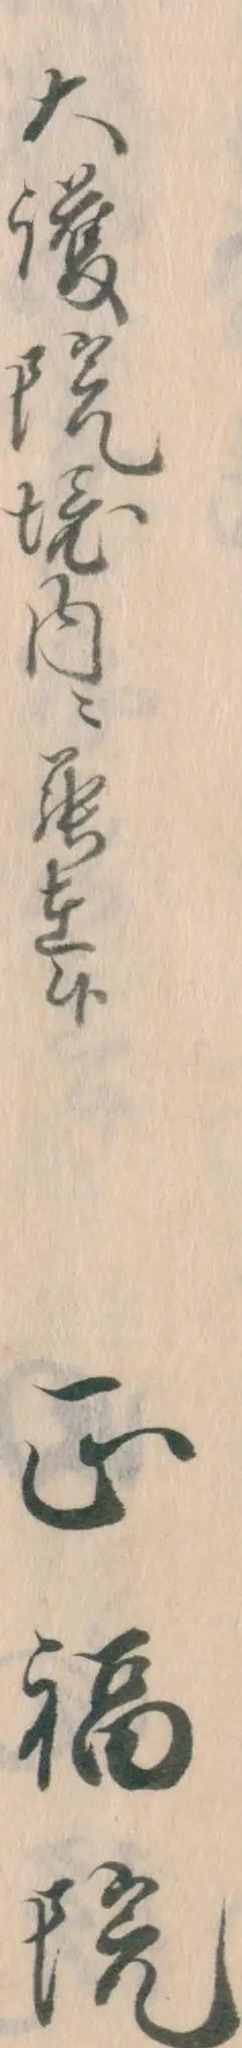大護院境内ニ罷在候正福院
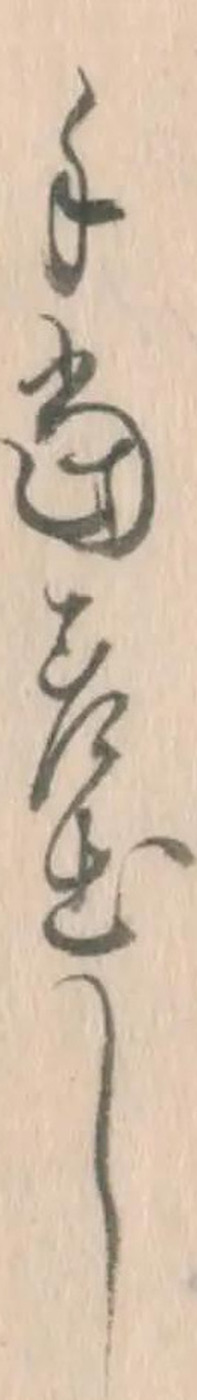手当差出し
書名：武家方并寺院等ニテ施差出候一件
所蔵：国立国会図書館 National Diet Library, JAPAN
